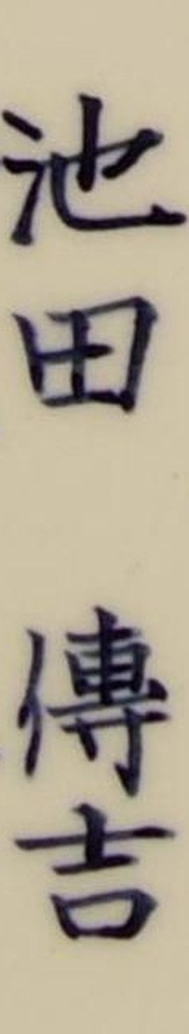池田傳吉
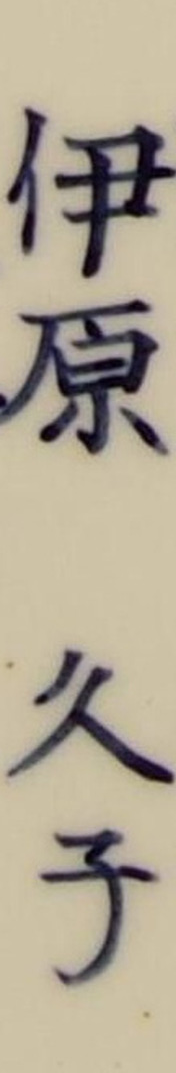伊原久子
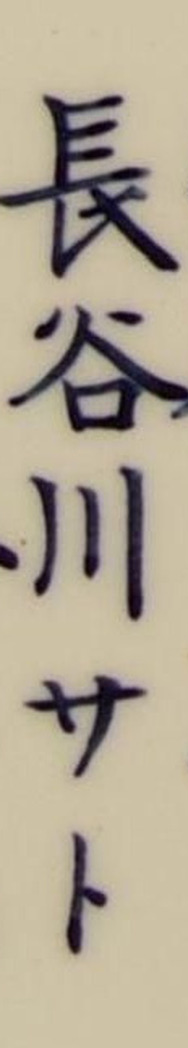長谷川サト
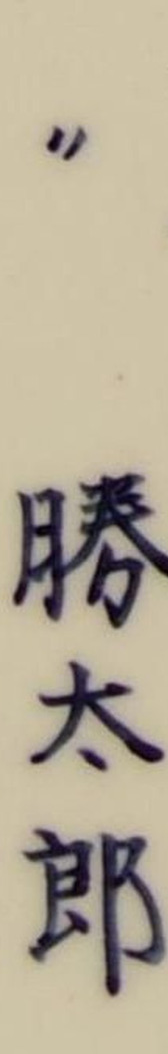勝太郎
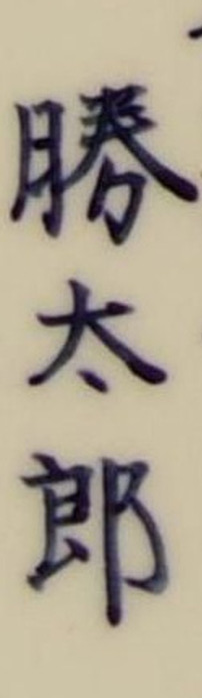勝太郎
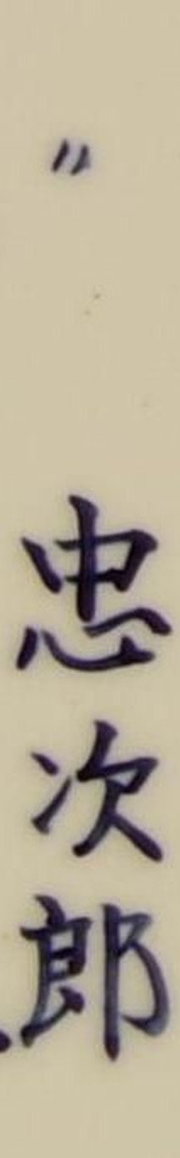忠次郎
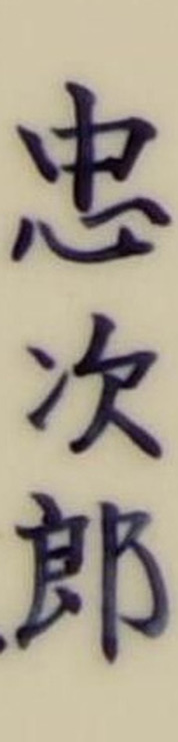忠次郎
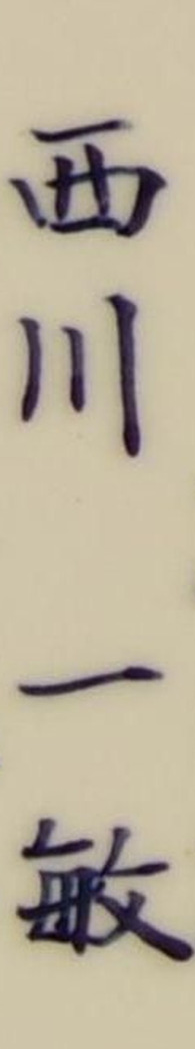西川一敏
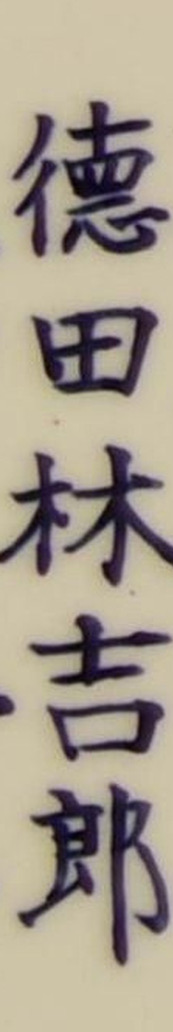徳田林吉郎
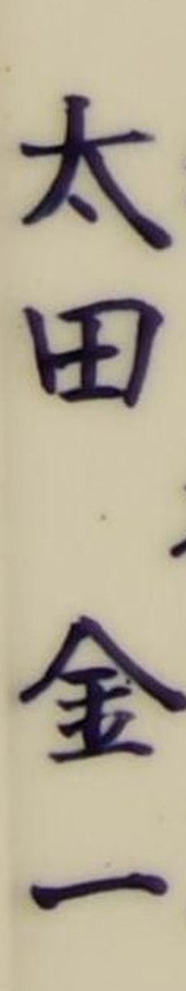太田金一

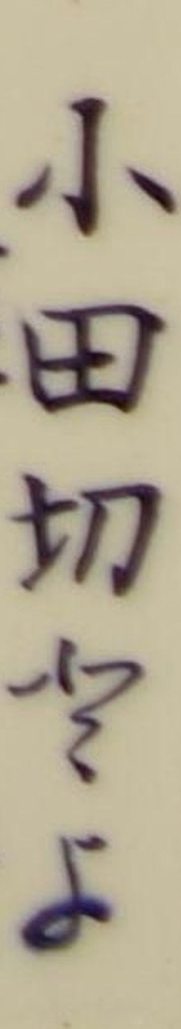小田切とよ
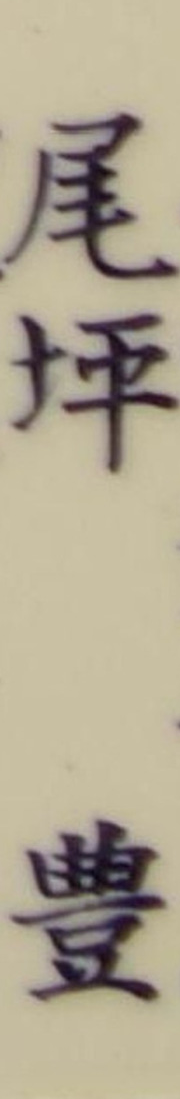尾坪豊
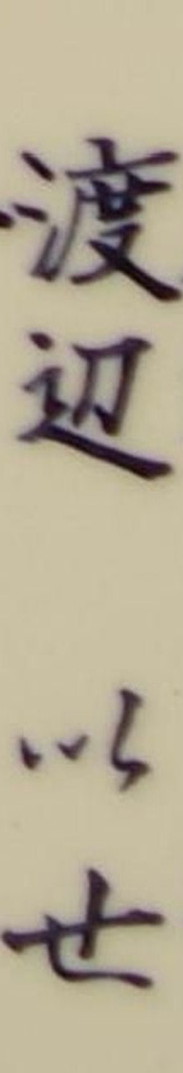渡辺いせ
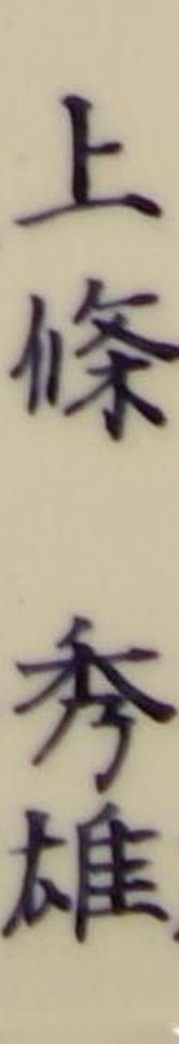上條秀雄
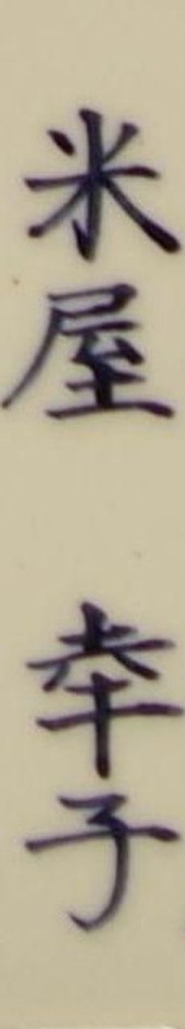米屋幸子
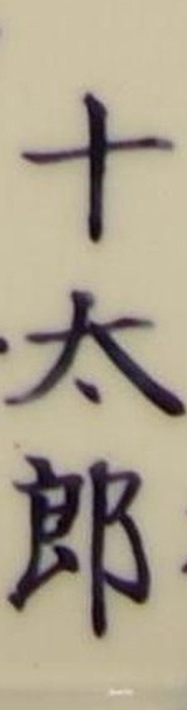十太郎
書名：E~L
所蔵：高野山金剛峯寺
